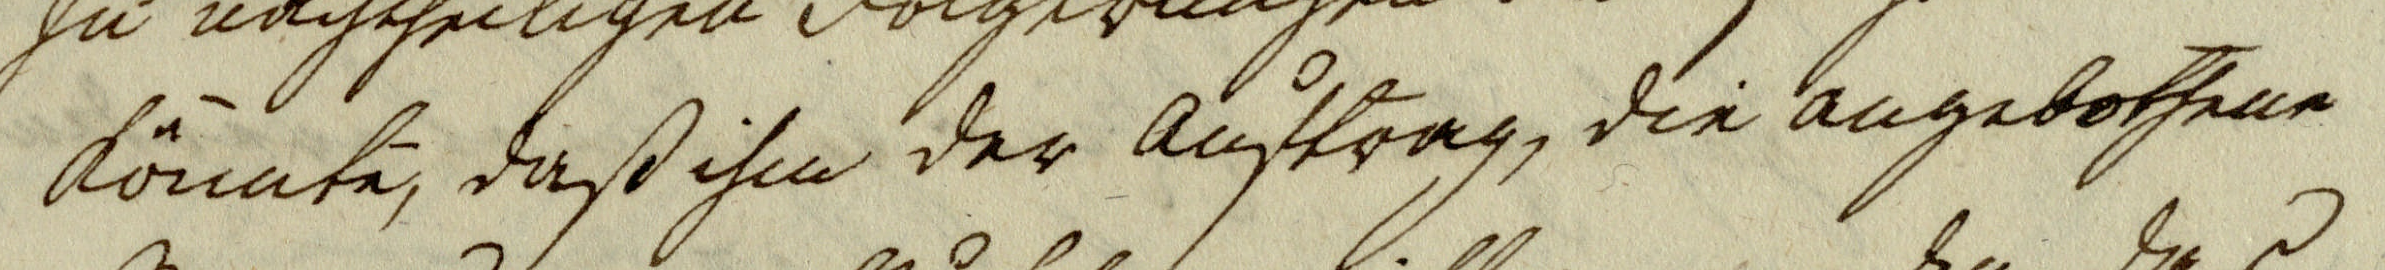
könnte, daß ihm der Auftrag, die angebothene
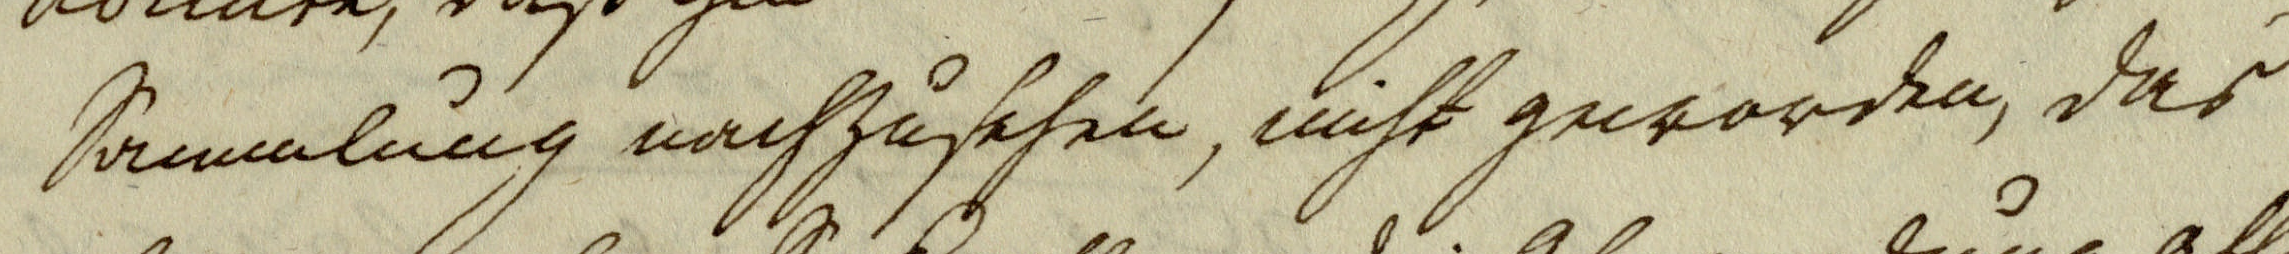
Sammlung nachzusehen, nicht geworden, das
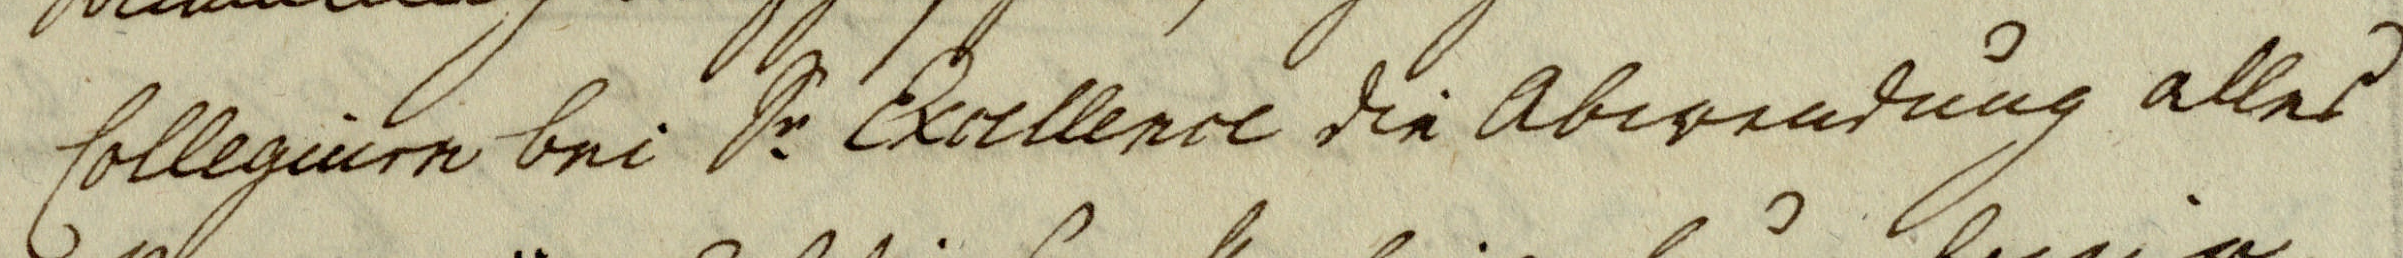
Collegium bei Sr. Excellence die Abwendung alles
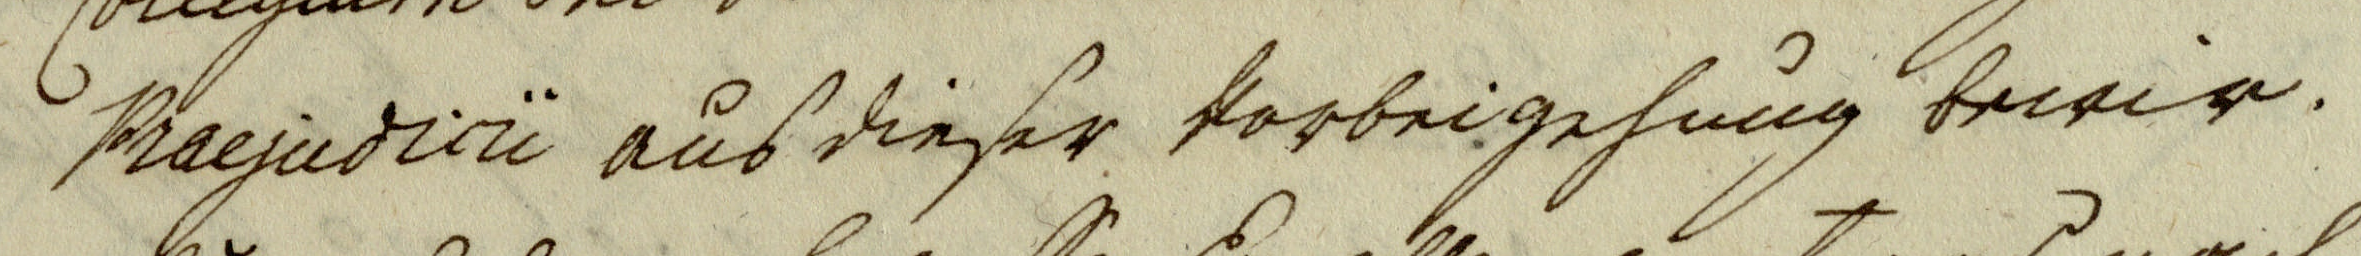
Praejudicii aus dieser Vorbeigehung bewir¬
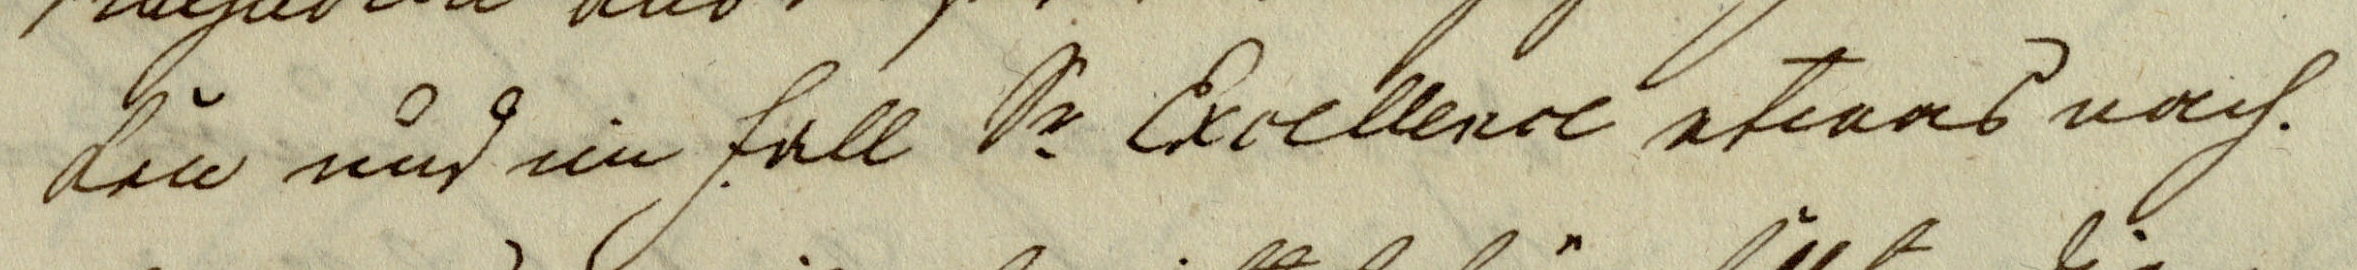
ken und im Fall Sr. Excellence etwas nach¬
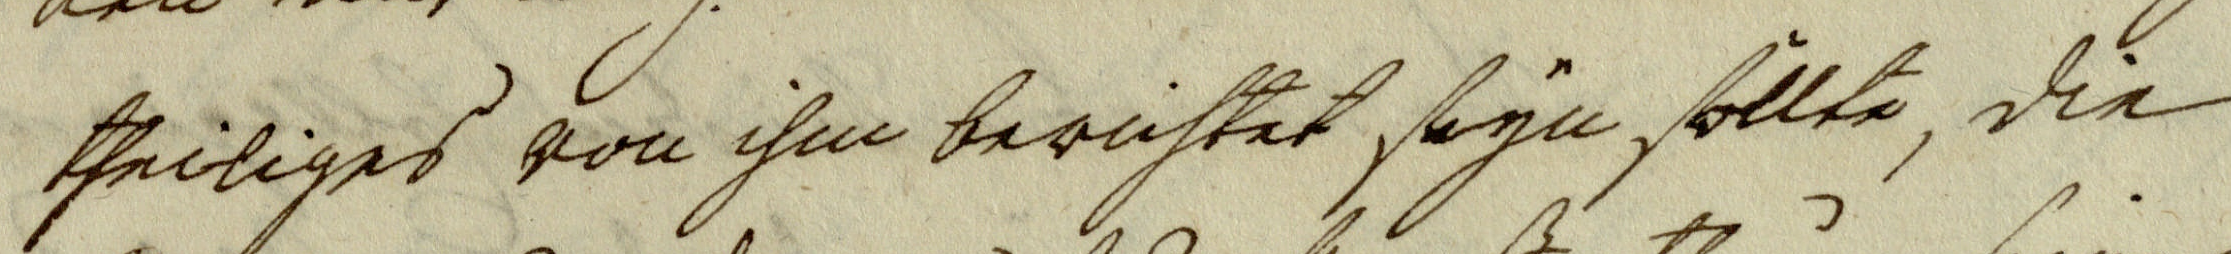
theiliges von ihm berichtet seÿn sollte, die
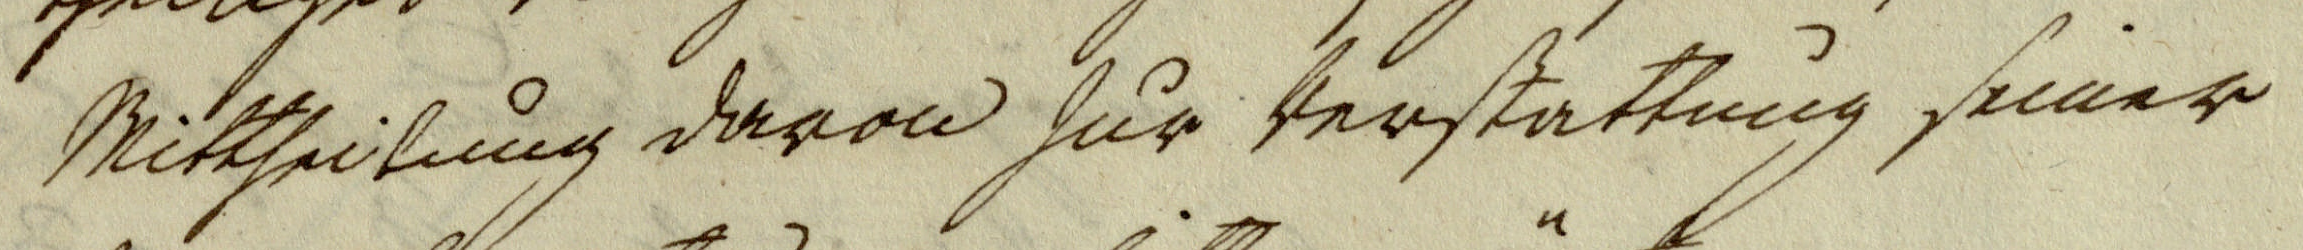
Mittheilung davon zur Verstattung seiner
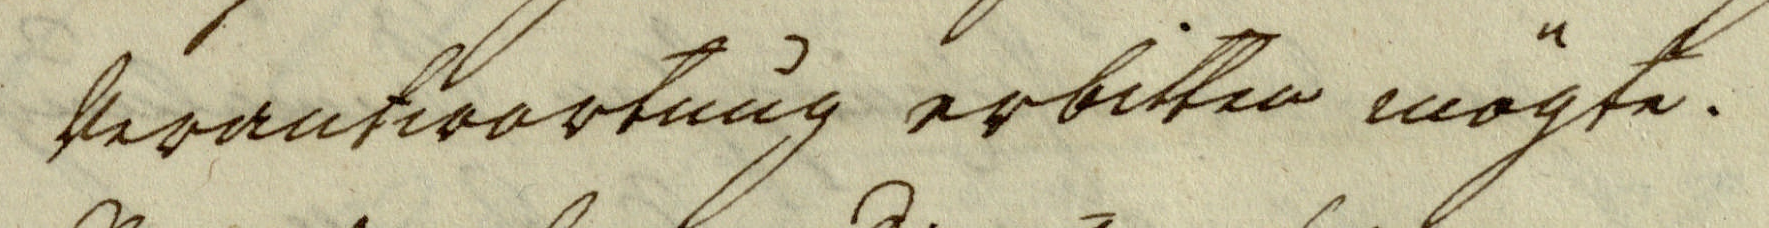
Verantwortung erbitten mögte.
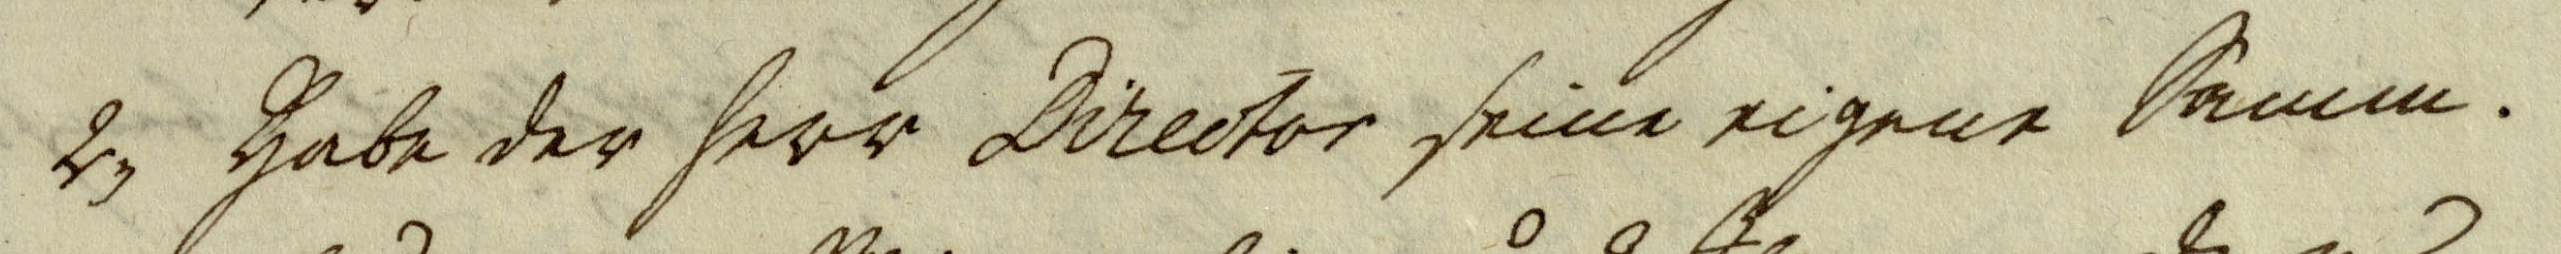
2., Habe der Herr Director seine eigene Samm¬
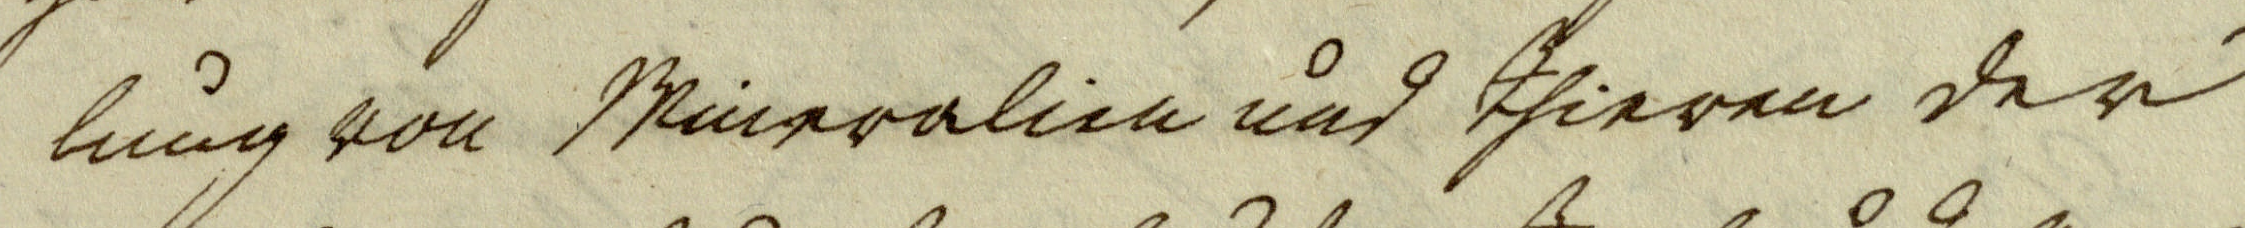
lung von Mineralien und Thieren der
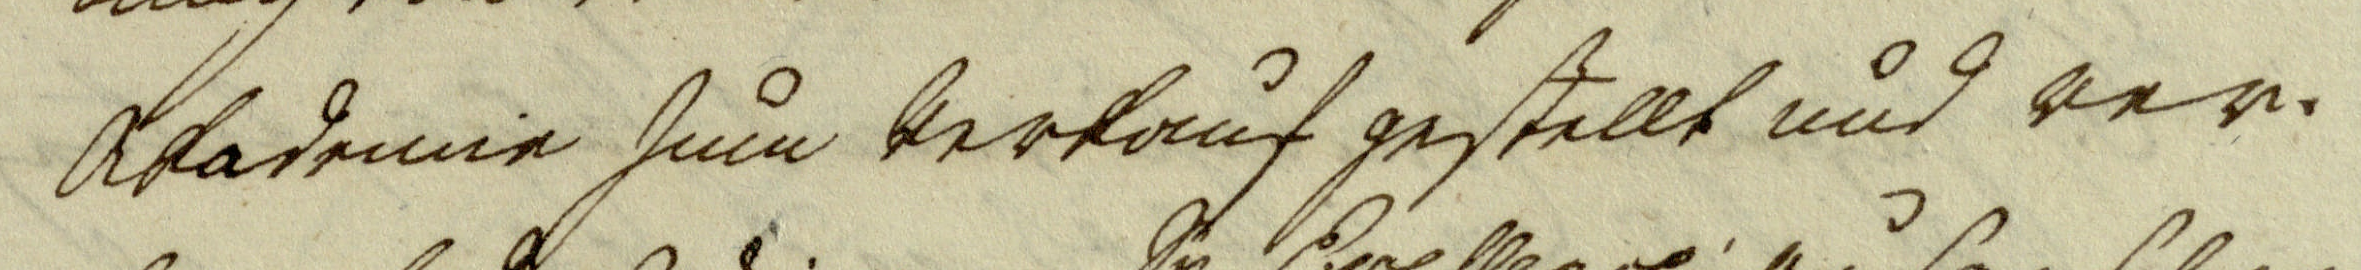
Akademie zum Verkauf gestellt und ver¬
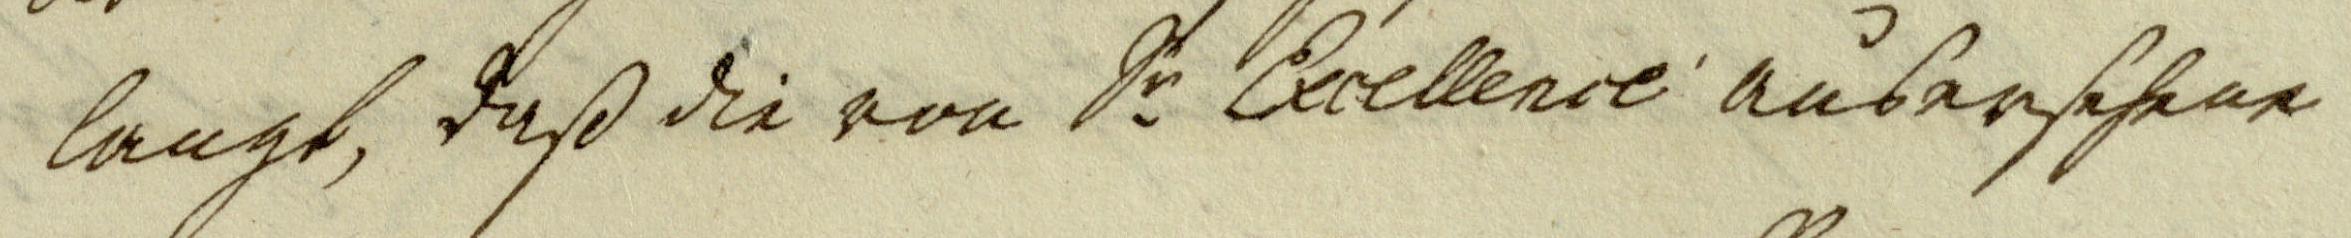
langt, daß die von Sr. Excellence ausersehene
